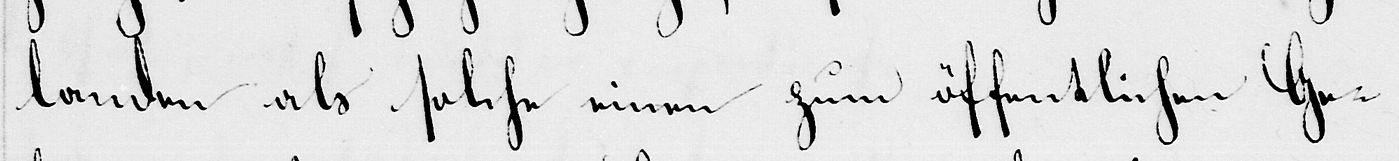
landen als solche einen zum öffentlichen Ge¬
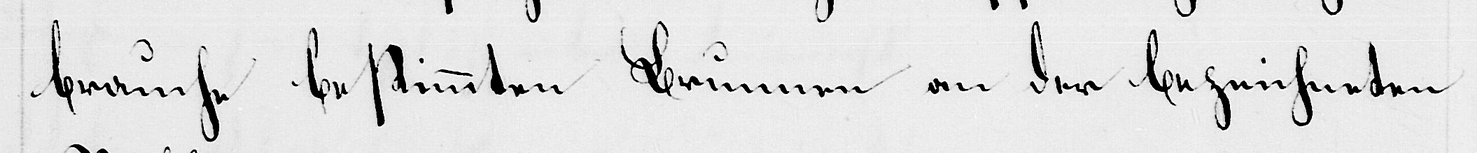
brauche bestimmten Brunnen an der bezeichneten
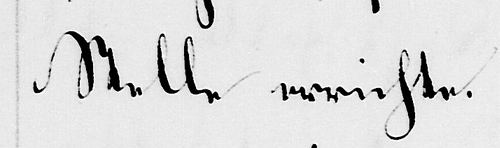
Stelle errichte.
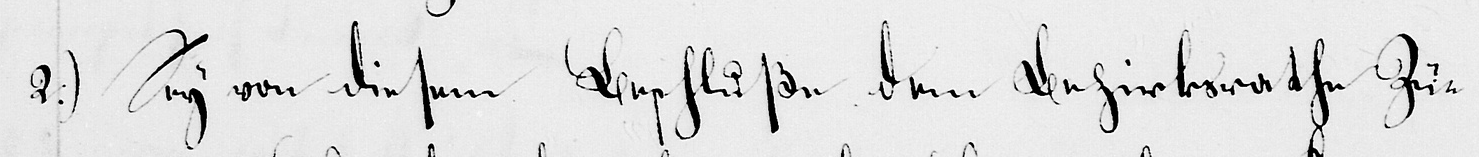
2.) Sey von diesem Beschluße dem Bezirksrathe Zü¬
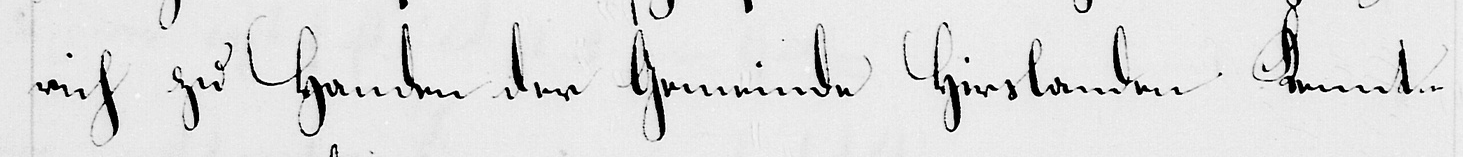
rich zu Handen der Gemeinde Hirslanden Kennt¬
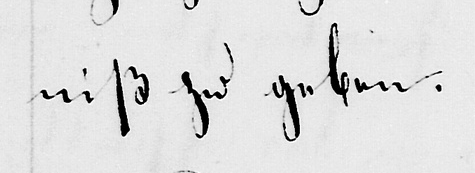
niß zu geben.
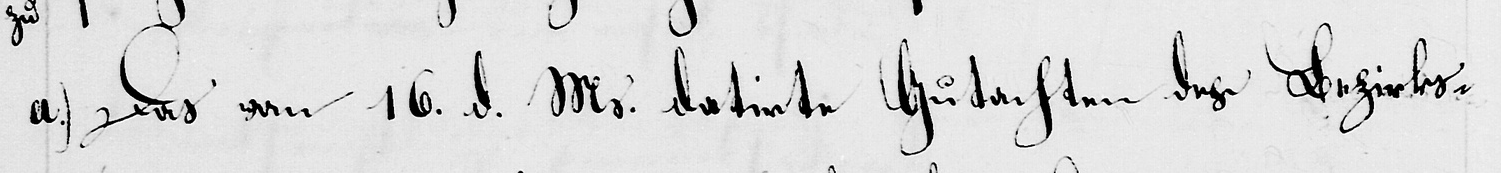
a.) Das vom 16. d. Ms. datirte Gutachten des Bezirks¬
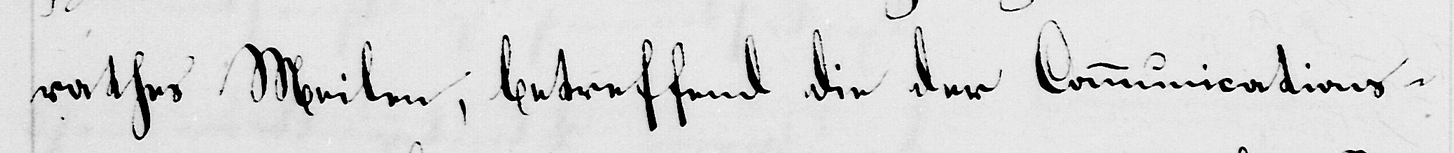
rathes Meilen, betreffend die der Communications¬
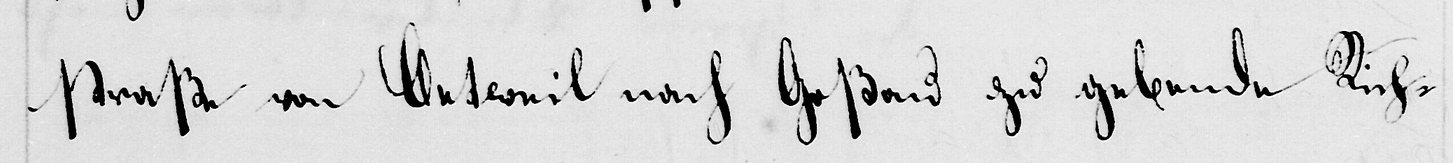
straße von Oetweil nach Goßau zu gebende Rich-
